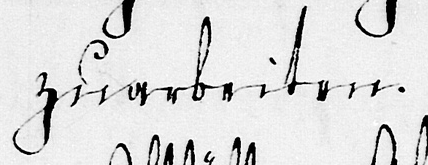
zuarbeiten.
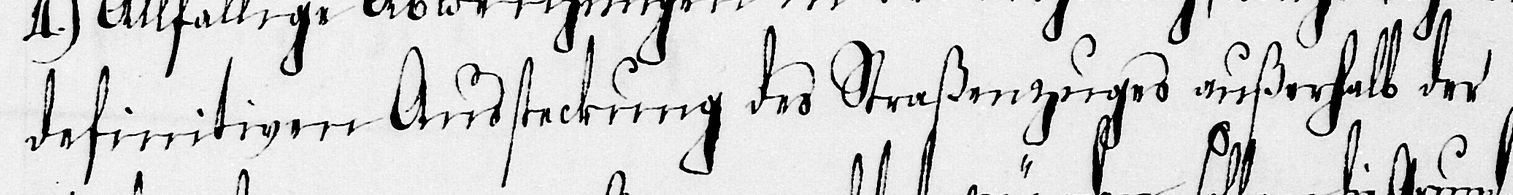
definitiven Aussteckung des Straßenzuges außerhalb der
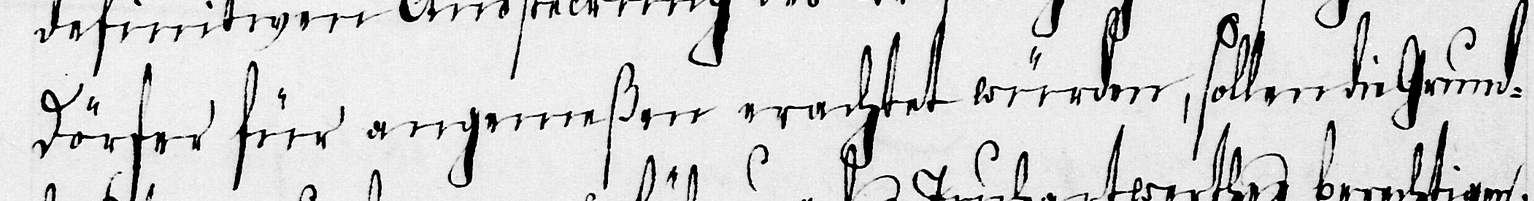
Dörfer für angemeßen erachtet würden, sollen die Grun¬
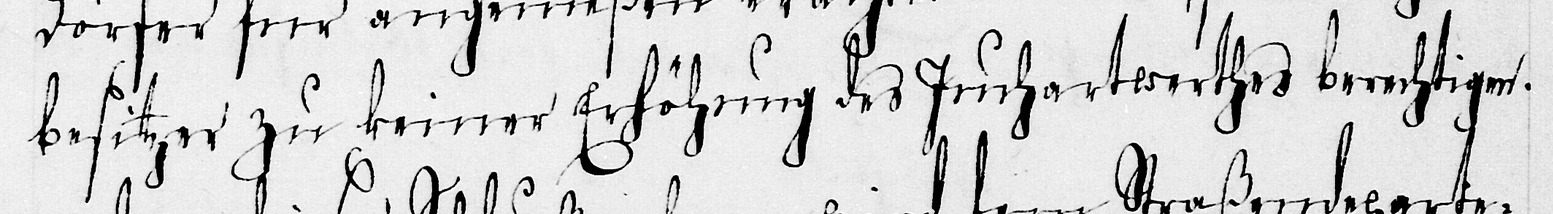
dbesitzer zu keiner Erhöhung des Juchartwerthes berechtigen.
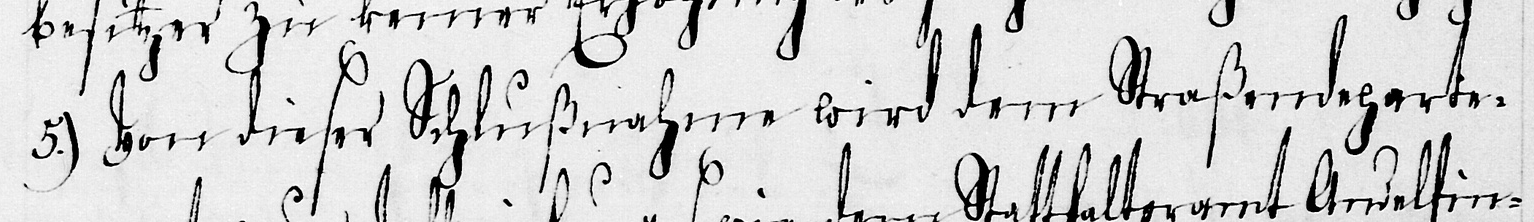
5.) Von dieser Schlußnahme wird dem Straßendeparte¬
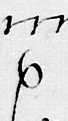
4.)
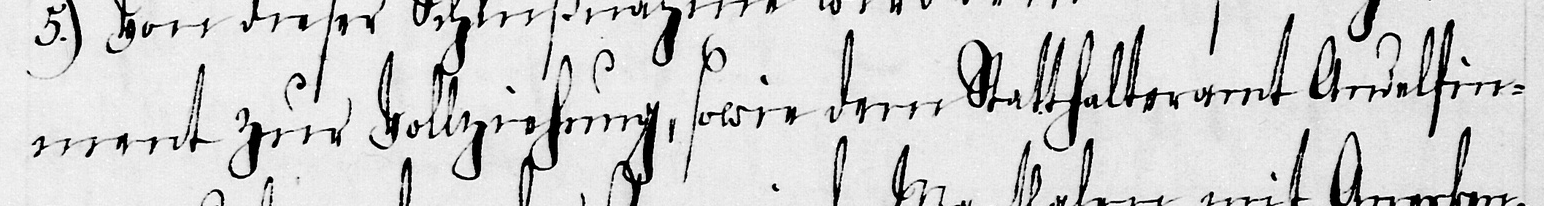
ment zur Vollziehung, sowie dem Statthalteramt Andelfin¬
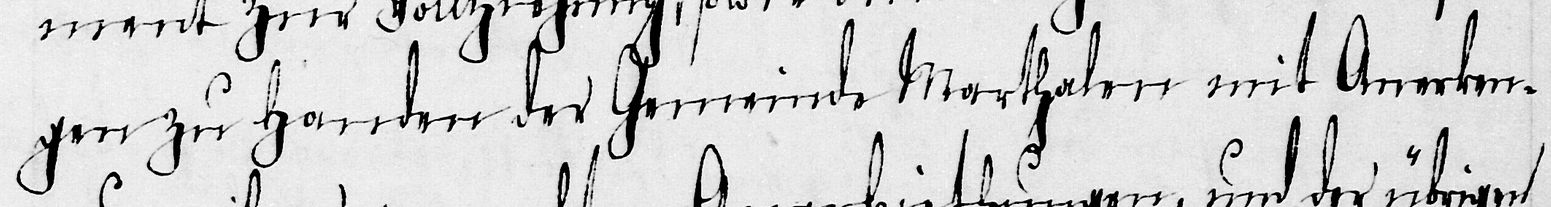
gen zu Handen der Gemeinde Marthalen mit Anerken¬
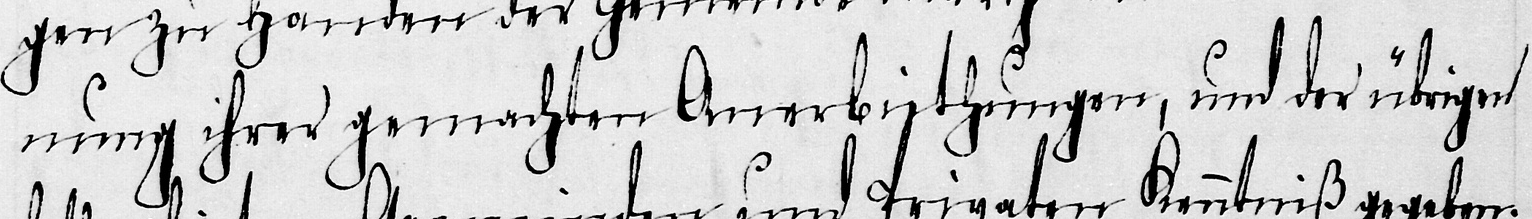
nung ihrer gemachten Anerbiethungen, und der übrigen
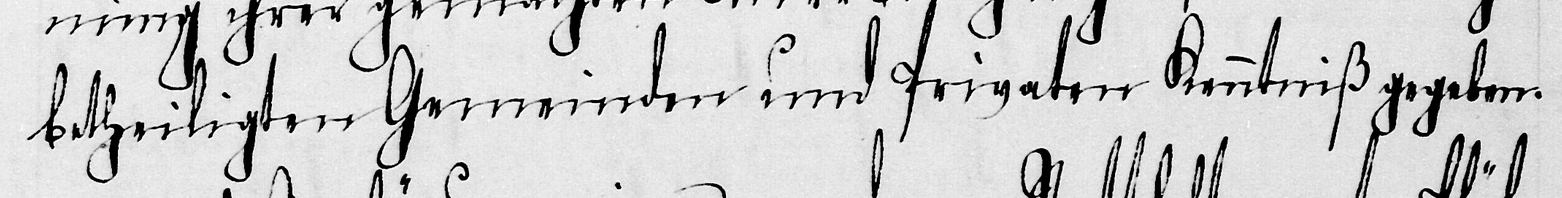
betheiligten Gemeinden und Privaten Kenntniß gegeben.
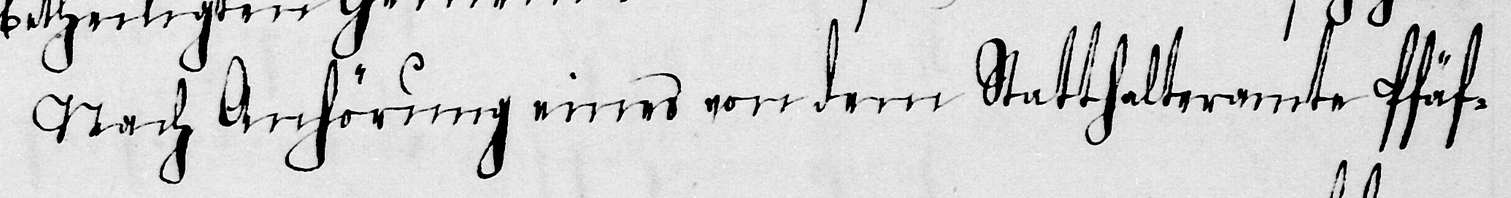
Nach Anhörung eines von dem Statthalteramte Pfäf-
